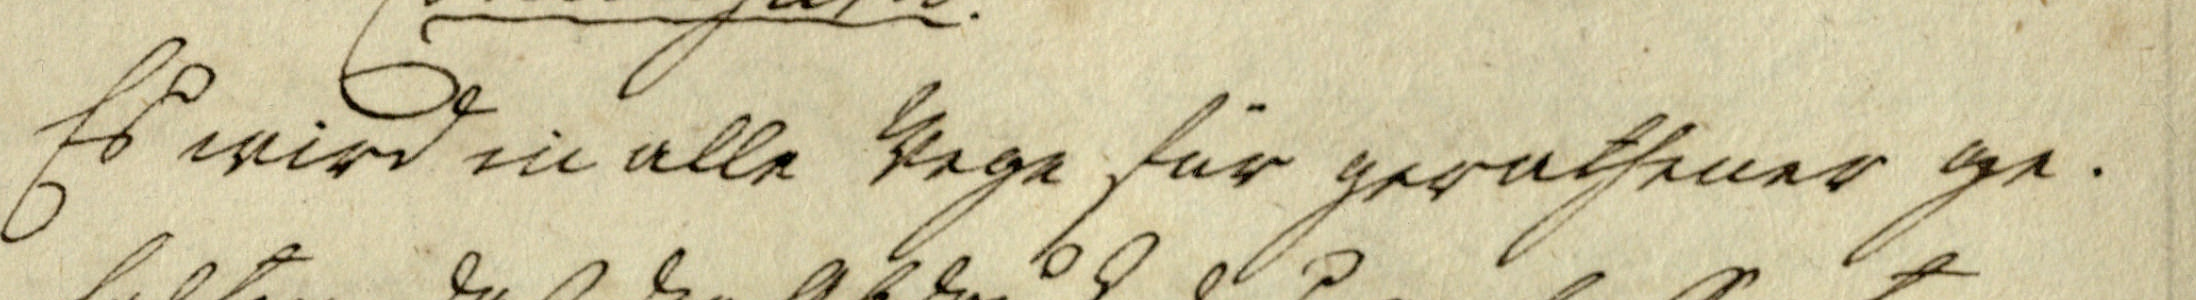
Es wird in alle Wege für gerathener ge¬
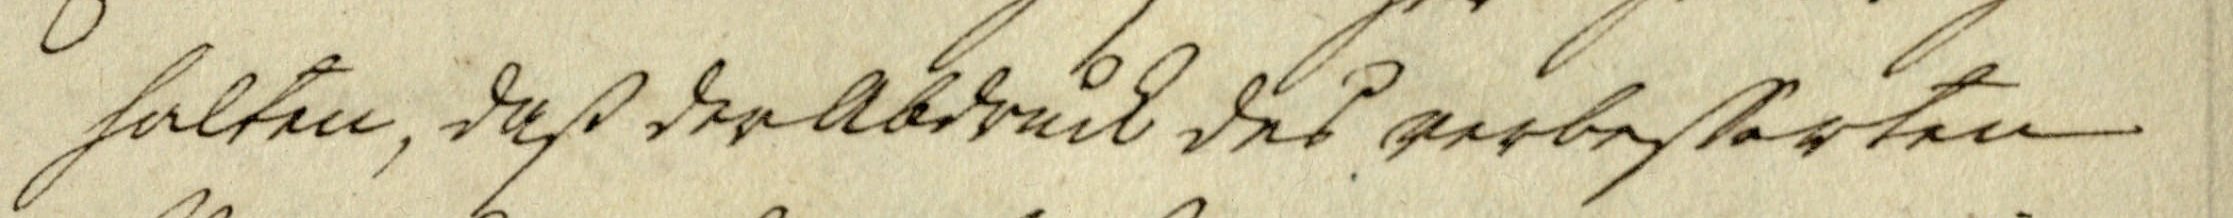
halten, daß der Abdruck des verbesserten
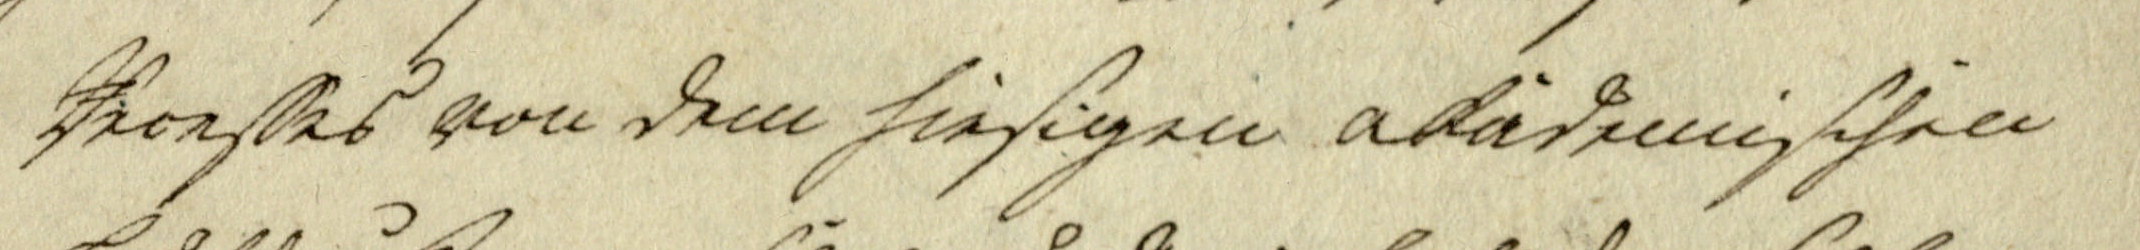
Recesses von dem hiesigen akademischen
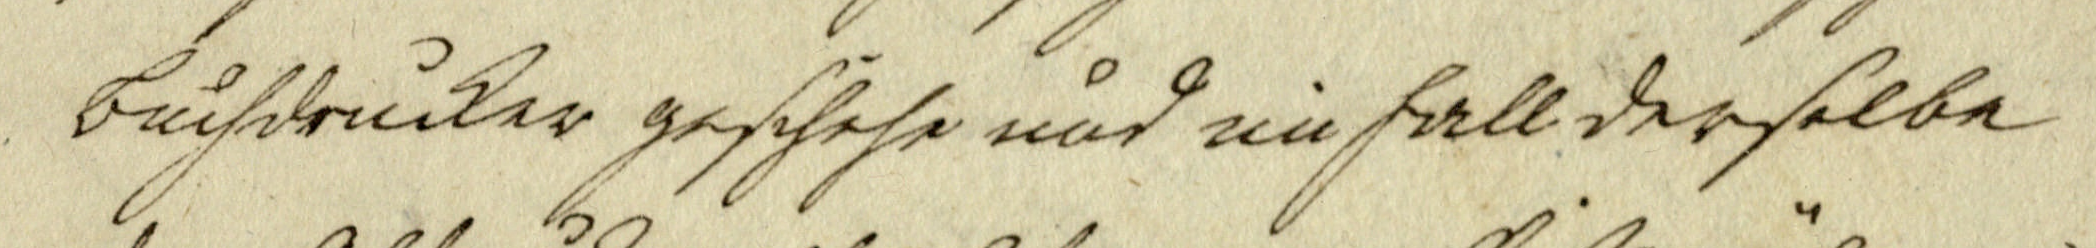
Buchdrucker geschehe und im Fall derselbe
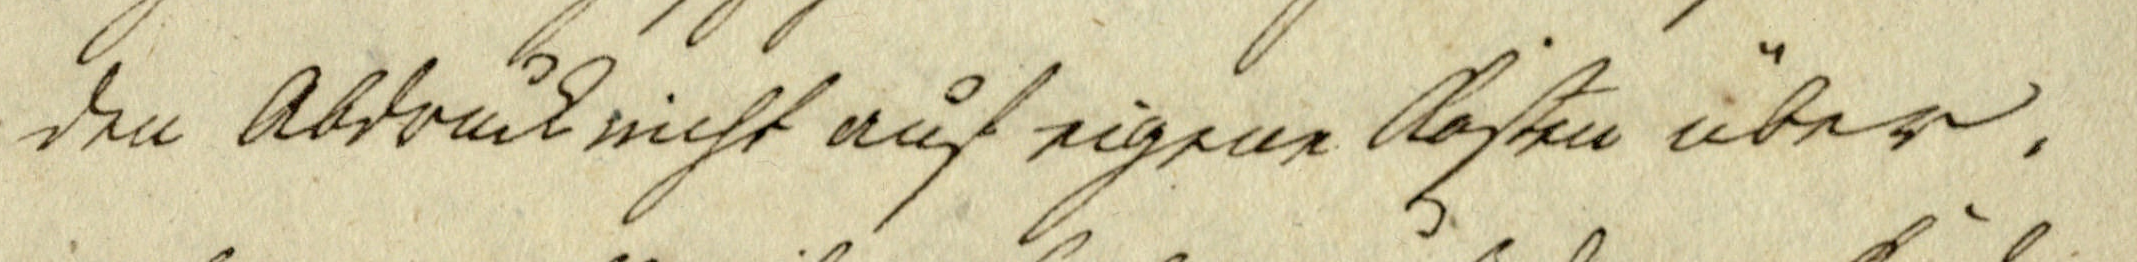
den Abdruck nicht auf eigene Kosten über¬
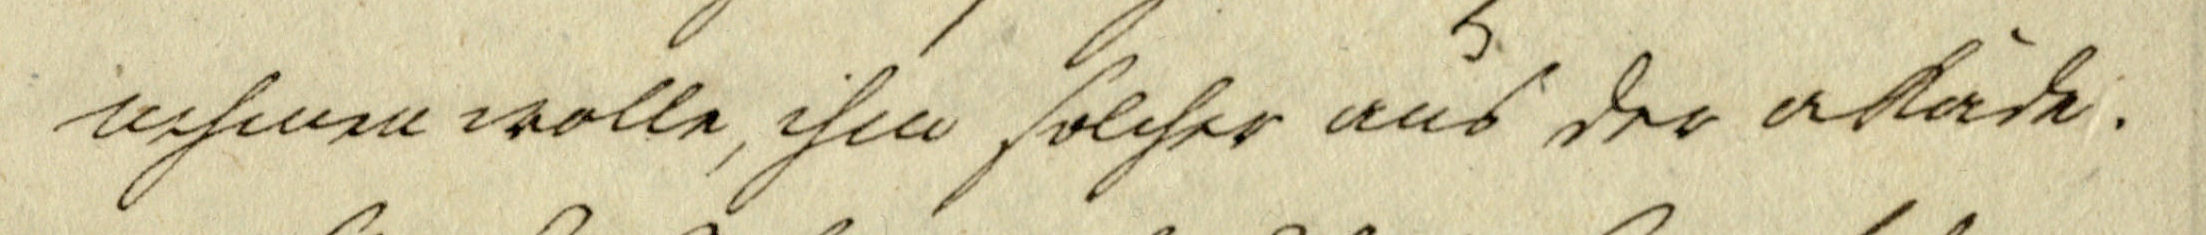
nehmen wolle, ihm solcher aus der akade¬
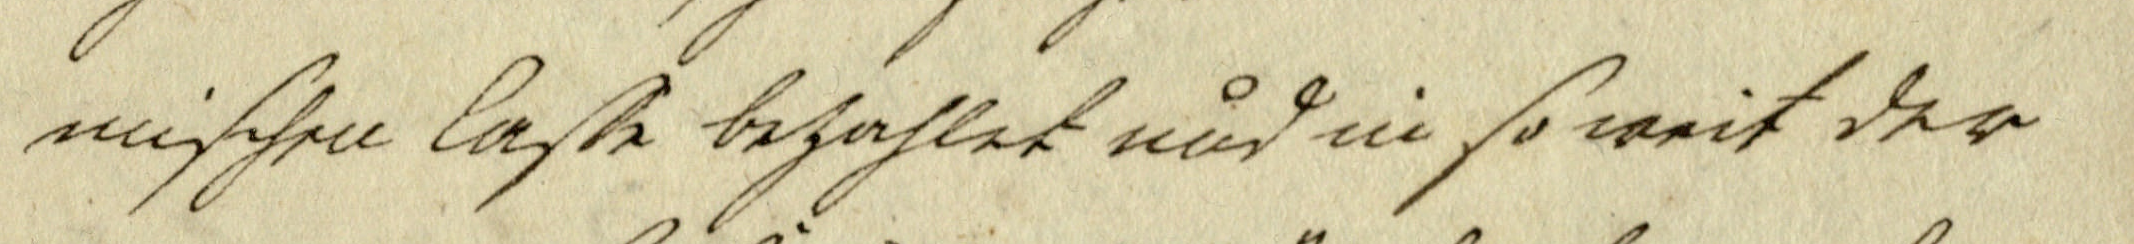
mischen Casse bezahlet und in so weit der
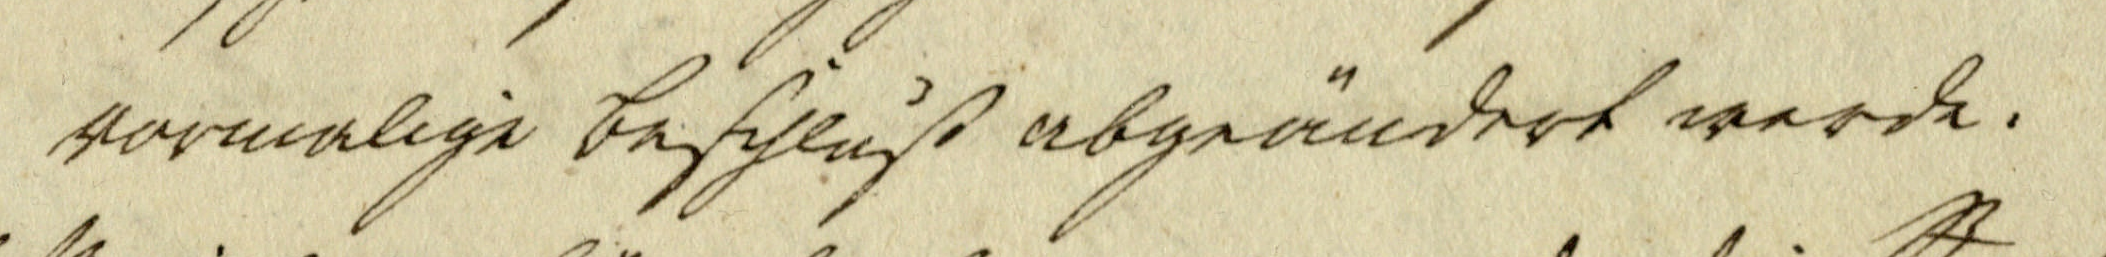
vormalige Beschluß abgeändert werde.
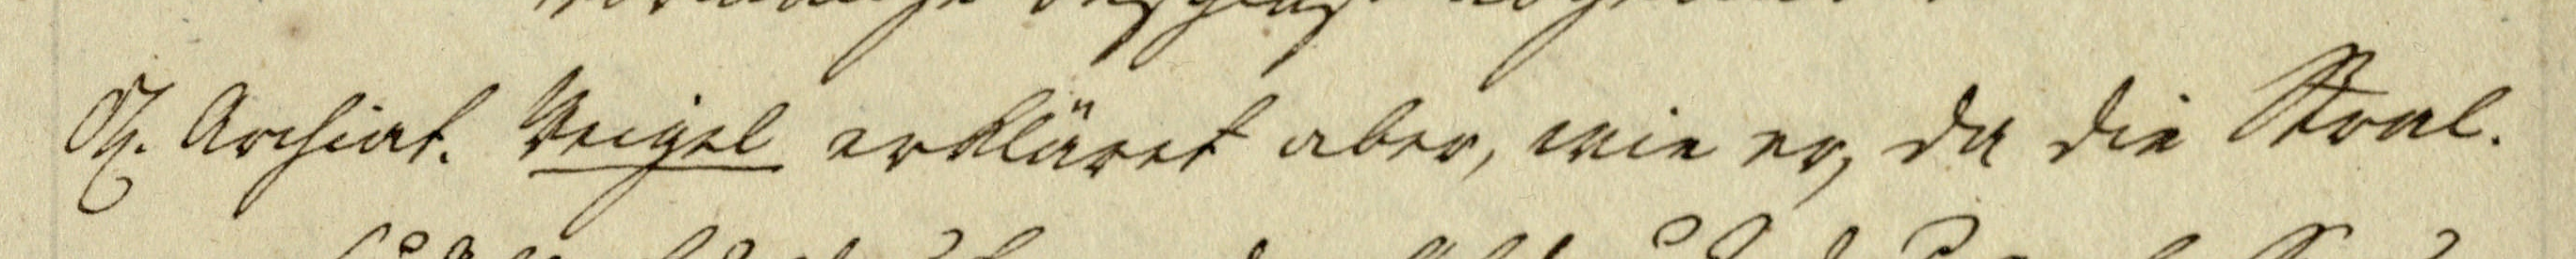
dh. Archiat. Weigel erkläret aber, wie er, da die Stral¬
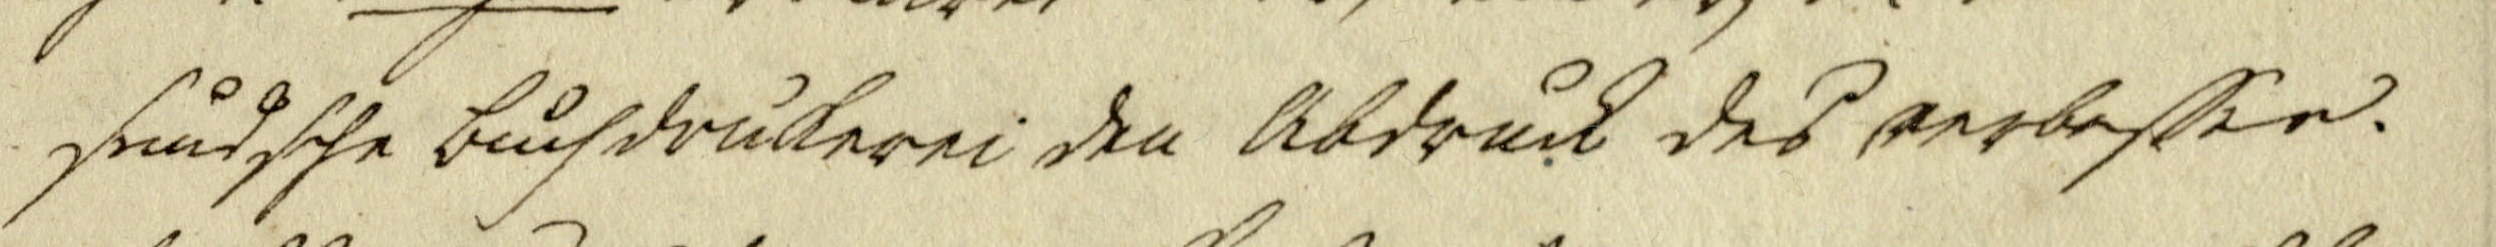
sundsche Buchdruckerei den Abdruck des verbesser¬
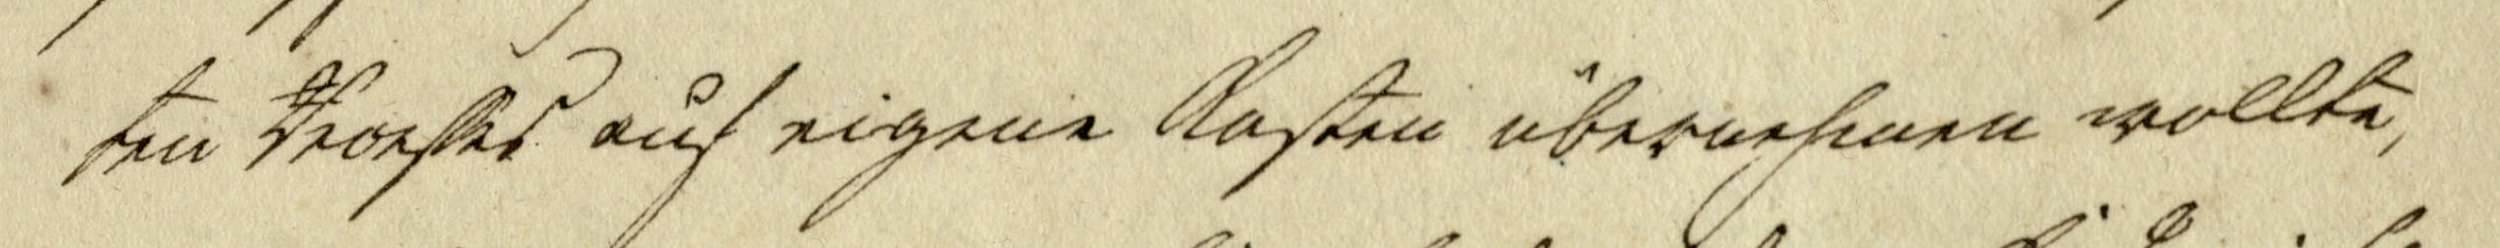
ten Recesses auf eigene Kosten übernehmen wollte,
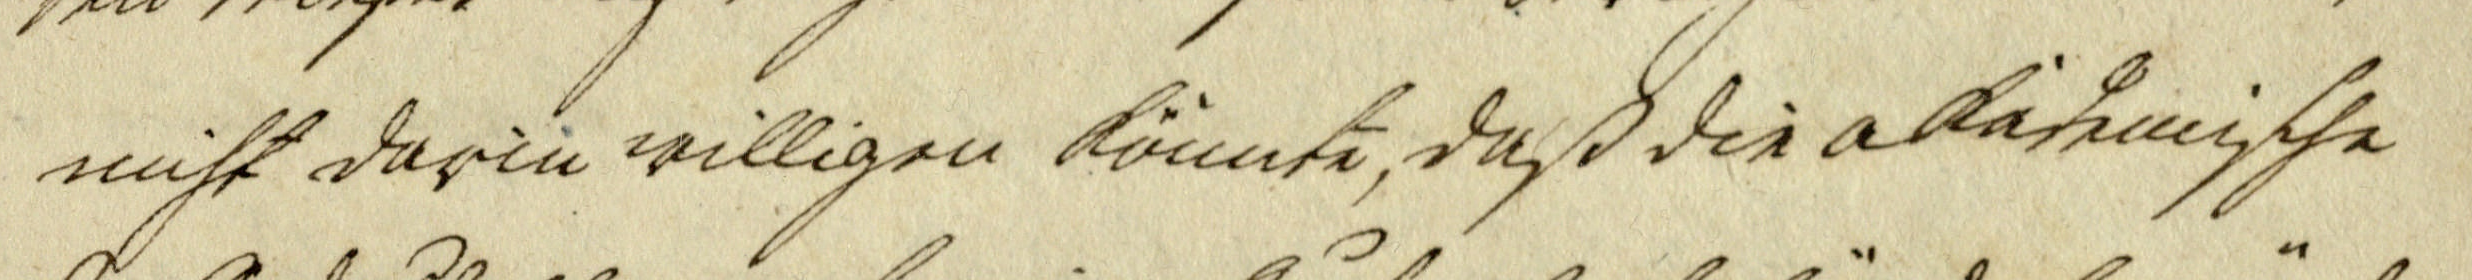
nicht darin willigen könnte, daß die akademische
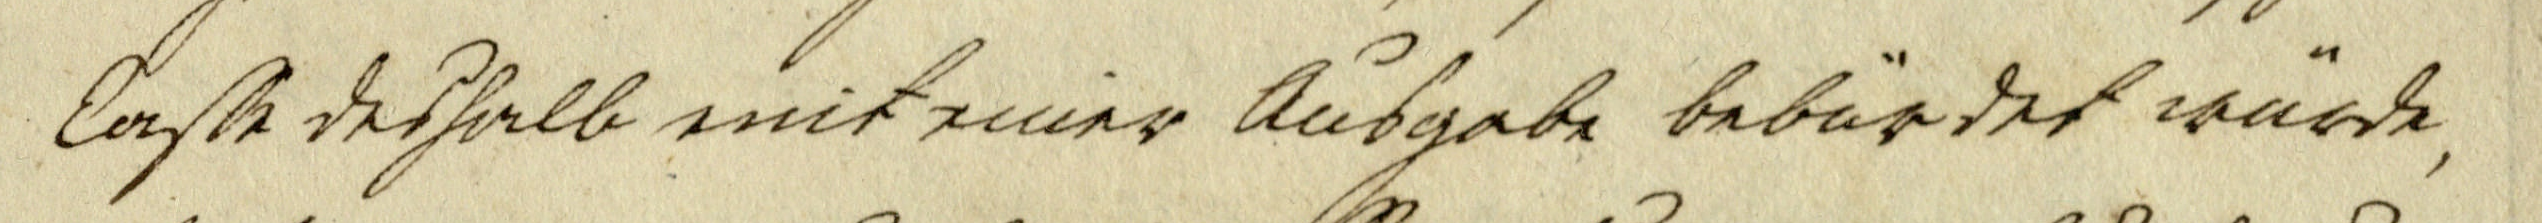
Casse deshalb mit einer Ausgabe bebürdet würde,
